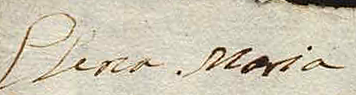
ELena. Maria
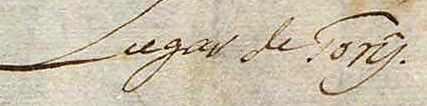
Lugar de Ton̄s.
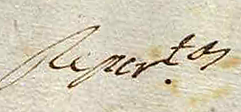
Reper.tos
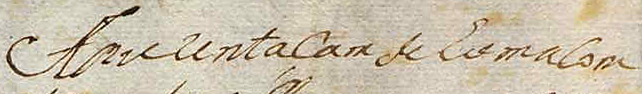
Aprezentaçam de huma com
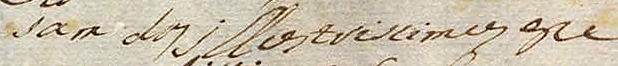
sam dos jllustriscimos e re
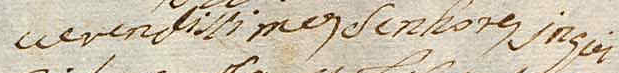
uerendissimos senhores jnqui
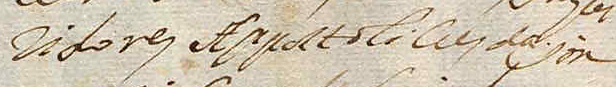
zidores Appostolicos da jm
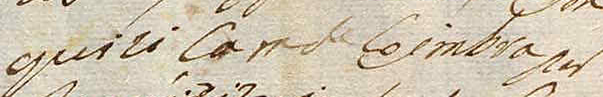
quiziÇam de Coimbra per
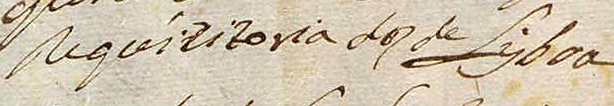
Requizitoria dos de Lisboa
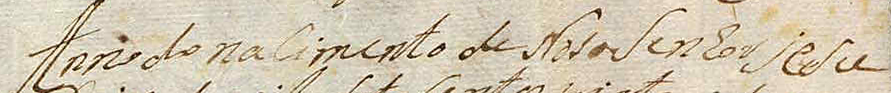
Anno do naCimento de Noso Senhor ieSu
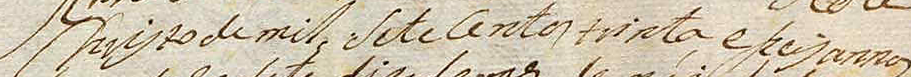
Christo de mil setecentos trinta e seis annos
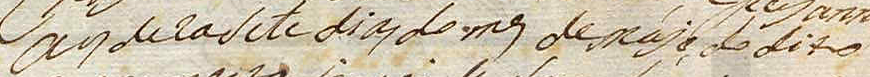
aos dezasete dias do mes de majo do dito
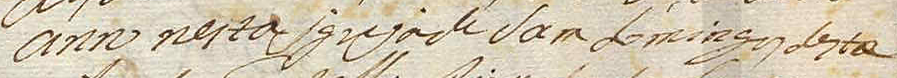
anno nesta jgreja de Sam domingos desta
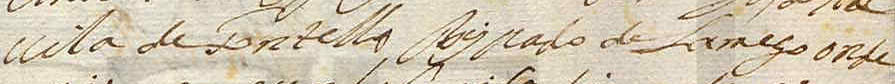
uila de Fontello Bispado de Lamego onde
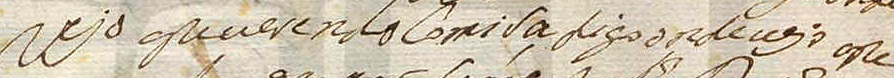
vejo quuerendo Comida digo onde uejo o Re
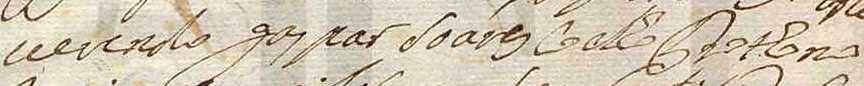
uerendo gaspar soares coelho Prothono
